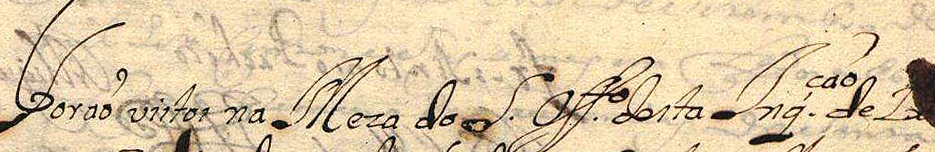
Foraõ vistos na Meza do S.o Off.o desta Inq.çaõ de Lx
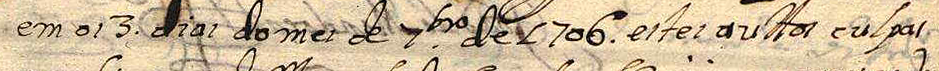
em os 3. dias do mes de 7.bro de 1706. estes auttos culpas
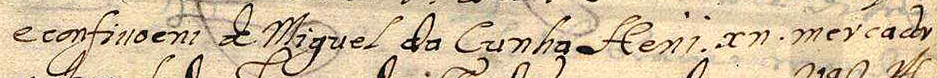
e confissoens de Miguel da Cunha Hens̄. xn. mercador
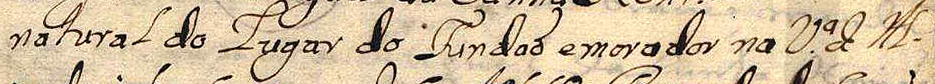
natural do Lugar do Fundaõ e morador na V.a d Al.
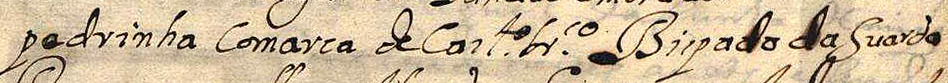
pedrinha Comarca de Cast.o br.co Bispado da Guarda
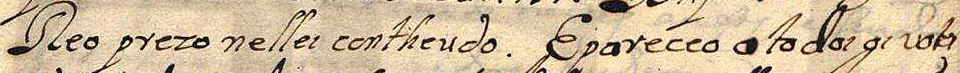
Reo prezo nelles contheudo. E pareceo a todos os votos
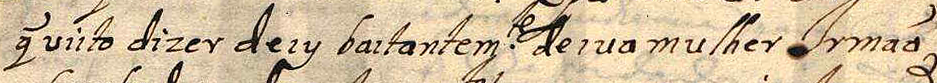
q̄ visto dizer de sy bastantem.te de sua mulher Irmaõ
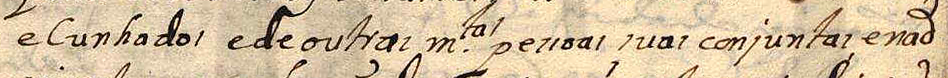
e Cunhados e de outras m.tas pessoas suas conjuntas, e naõ
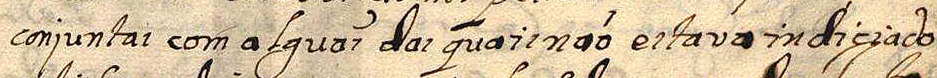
conjuntas com alguas̄ dos quais naõ estava indiciado
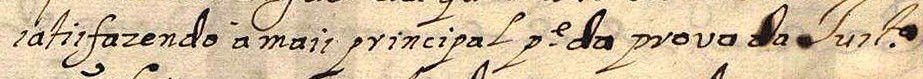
satisfazendo à mais principal p.e da prova da Iust.a
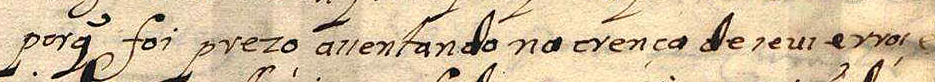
porq̄ foi prezo assentando na crença de seus erros, e
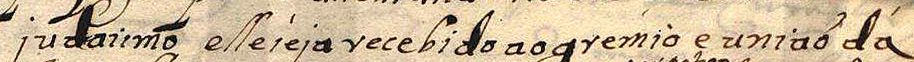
judaismo elle seja recebido ao gremio e uniaõ da
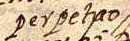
perpetuo
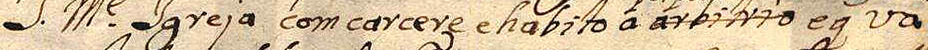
S. M.e Igreja com carcere e habito a arbitrio e q̄ và
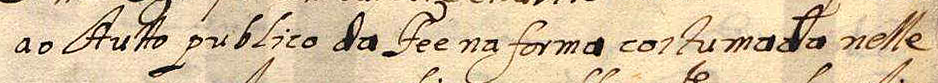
ao Autto publico da Fee na forma costumada nelle
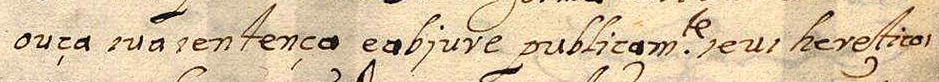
ouça sua sentença e abjure publicam.te seus hereticos
